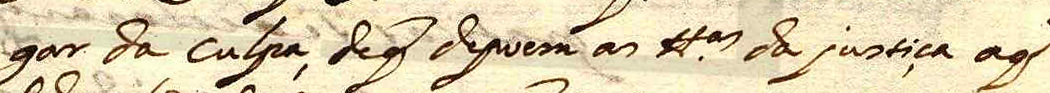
gar da culpa, de q̄ depoem as tt.as da justiça a q̄
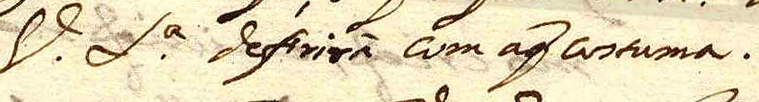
V. S.a defirirà com a q̄ costuma.
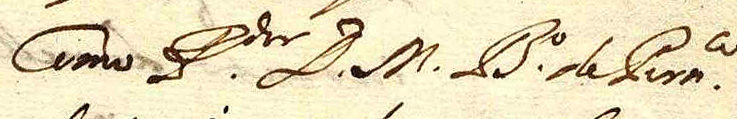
Como P.dor V. M. B.o de Pern.co
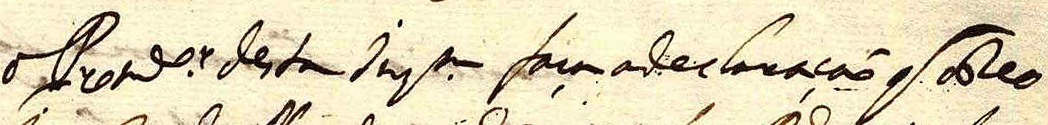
o Prom.tor desta Inq.m faça a declaraçaõ q̄ o Reo
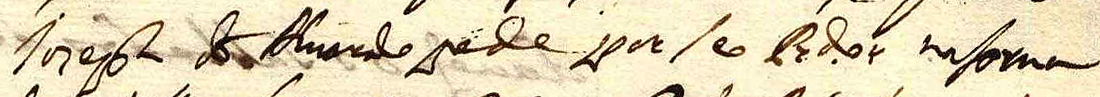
Iozeph d̄ Aluarado pede por seo Pr.dor na forma
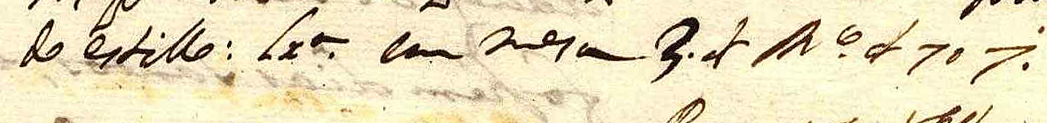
do estillo: Lxa. em mesa 3. d̄ M.ço d̄ 707.
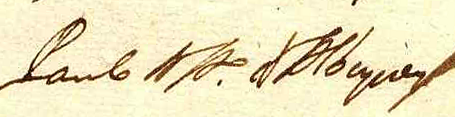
Paulo Aff.o d̄ Albuquerq̄
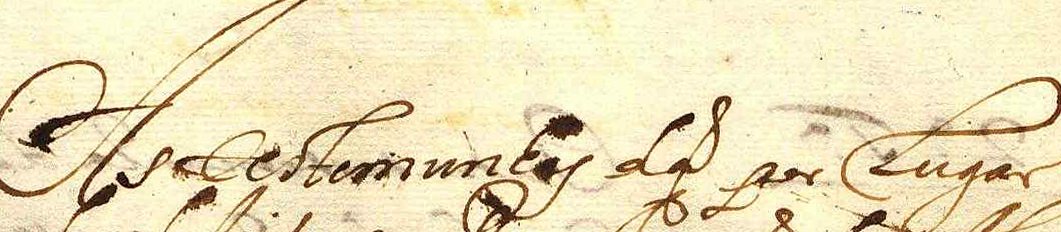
As testemunhas daõ por Lugar
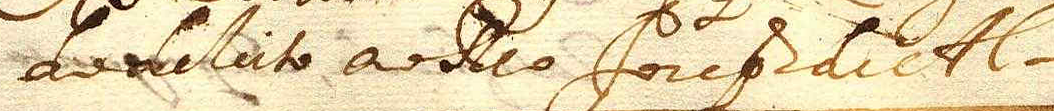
do delicto ao Reo Jozeph de Al
